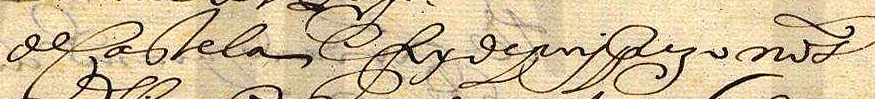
de Castela E foy depois pRezo no sto
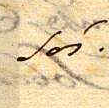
sós.
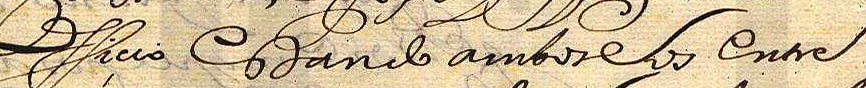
Officio estando ambos Sos entre
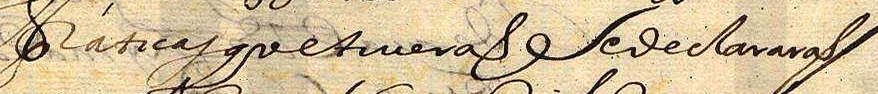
pRaticas que tiueraõ Se declararaõ
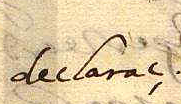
declaraç.
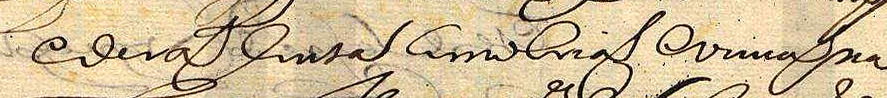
e deraõ Conta Como Criaõ e viuiaõ na
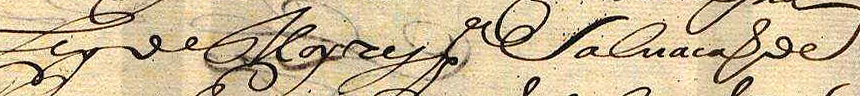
Ley de Moyzes pa Saluaçaõ de
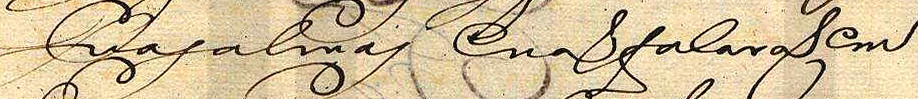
suas almas E naõ falaraõ em
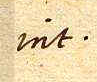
int.
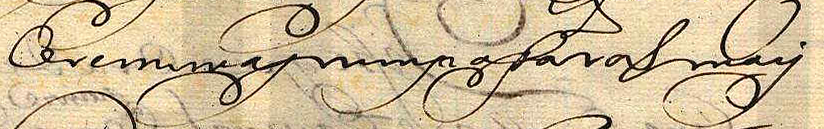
Ceremonias nem passaraõ mais
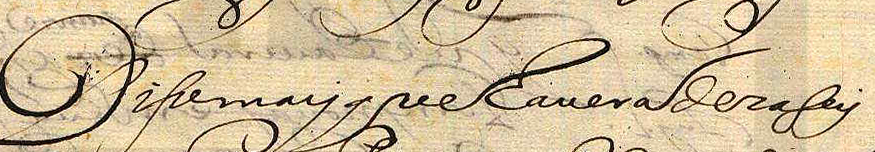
Disse mais que hauera dezaseis
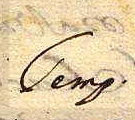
Temp.
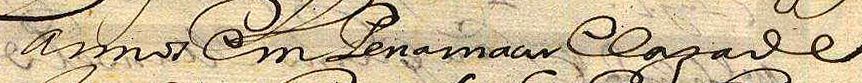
annos em Penamacor E Caza de
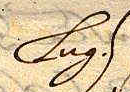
Lug.
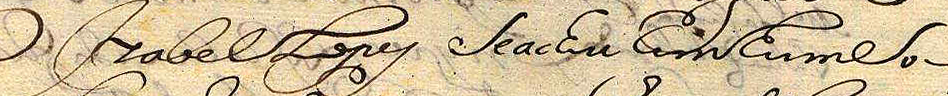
Jzabel Lopes Se achou com hum So
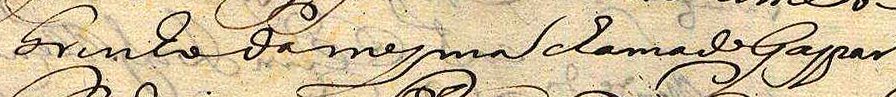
brinho da mesma chamado Gaspar
